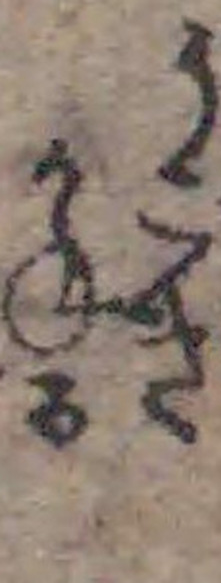かねる
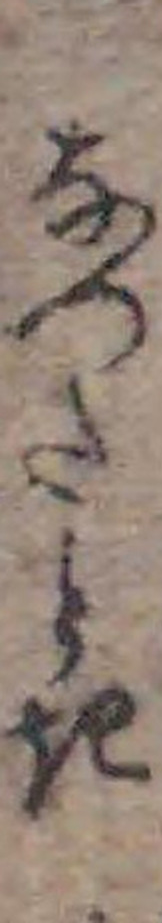なつたとき
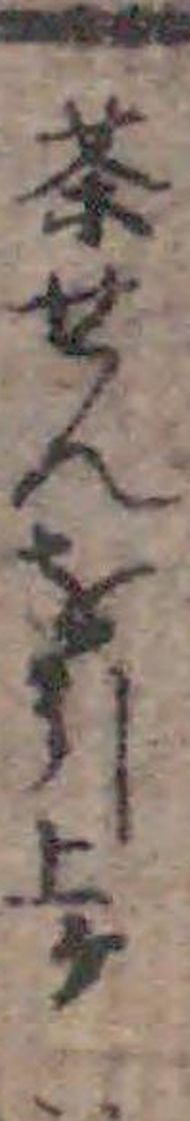茶せんを引上
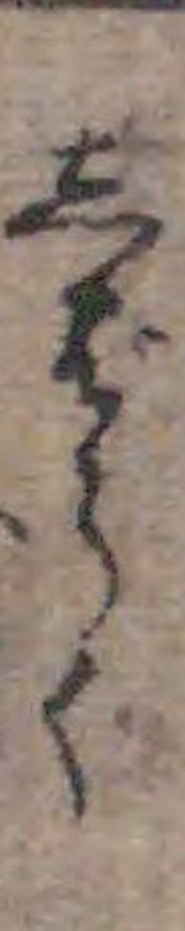しばらく
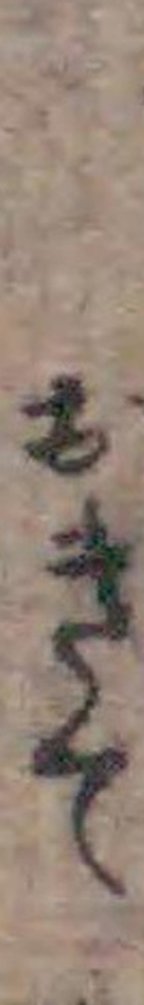おきて
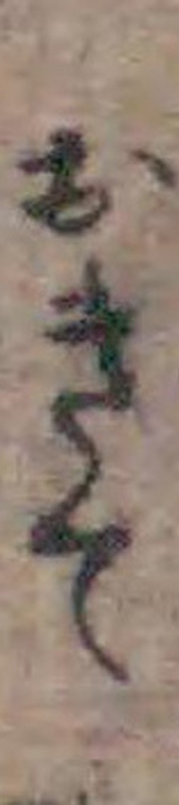おきて
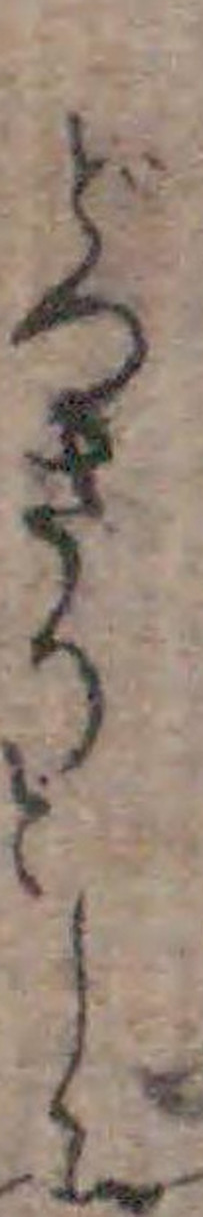どつきりと
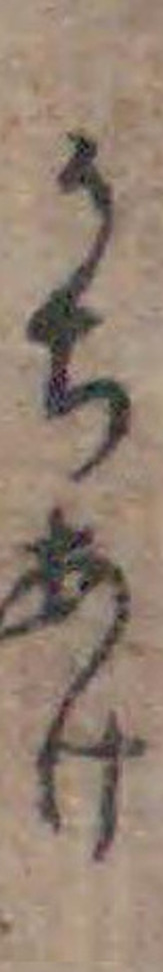うちあけ
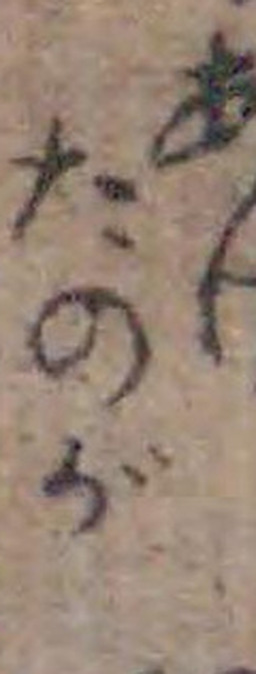たのが
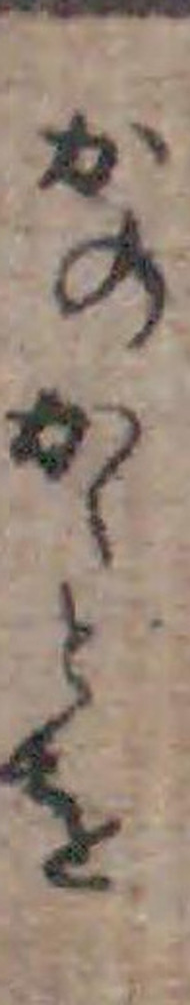かのかゝとを
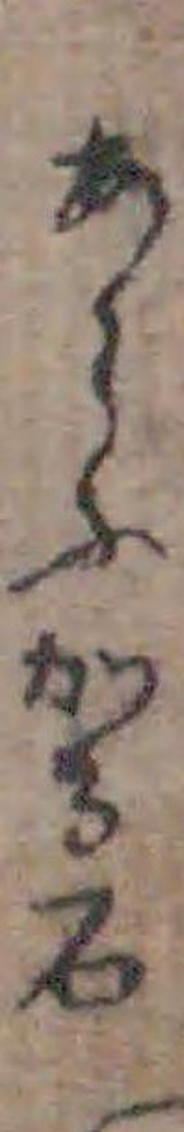あらふかる石

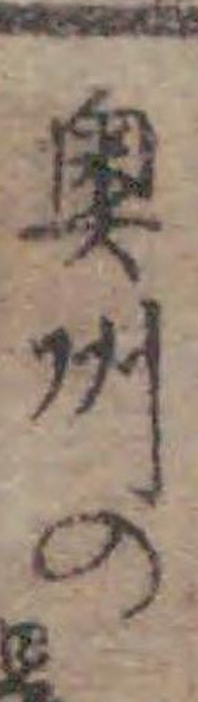奥州の
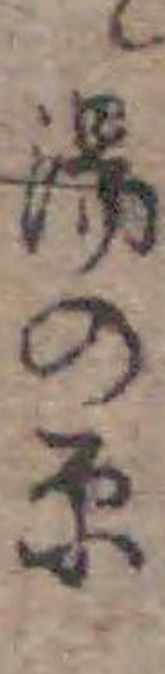湯の原
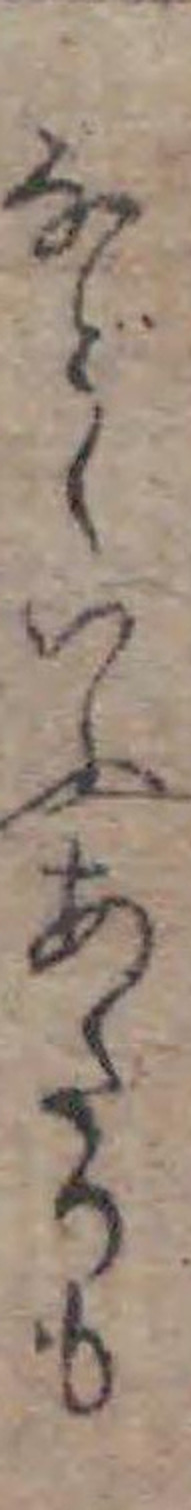などゝいふあたりも
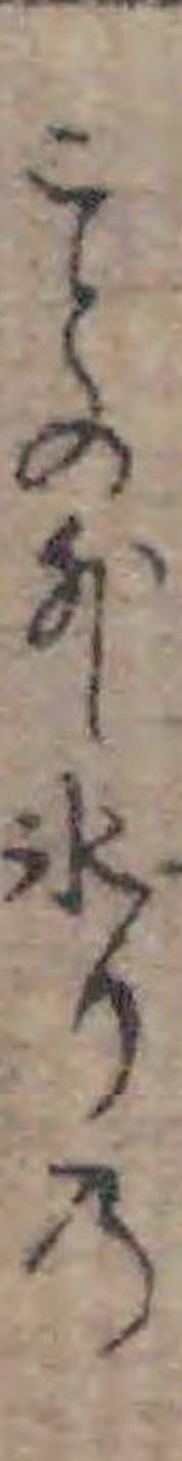ことの外氷りの
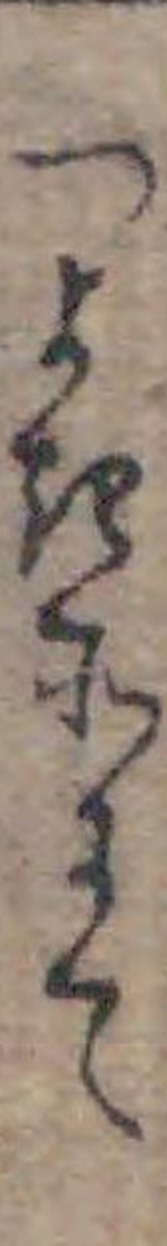つよき所にて
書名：虚言八百万八伝 : 3巻
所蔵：国立国会図書館 National Diet Library, JAPAN
